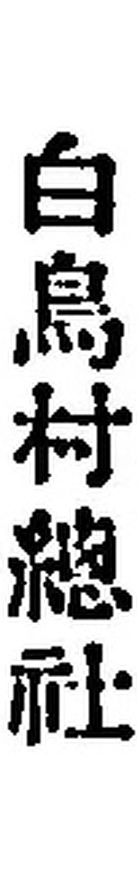白鳥村総社
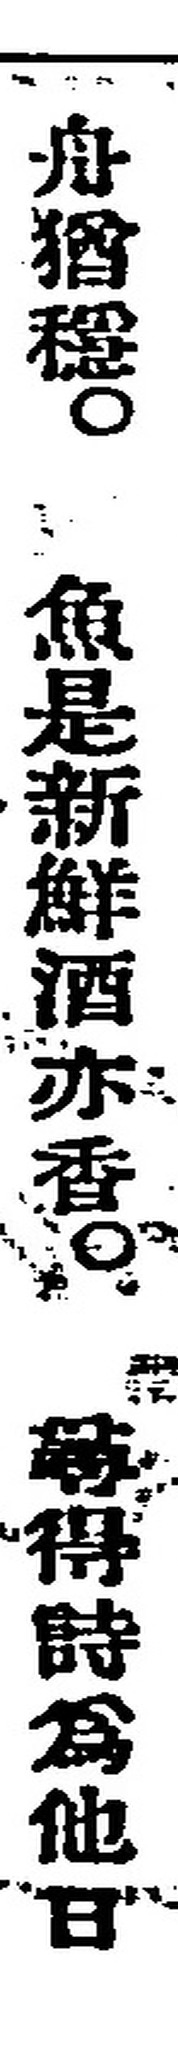舟猶穏。魚是新鮮酒亦香。尋得詩為他日
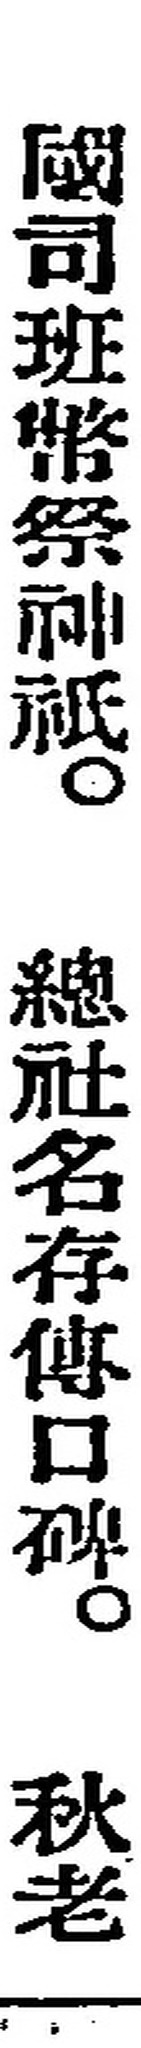国司班幣祭神祇。総社名存伝口碑。秋老
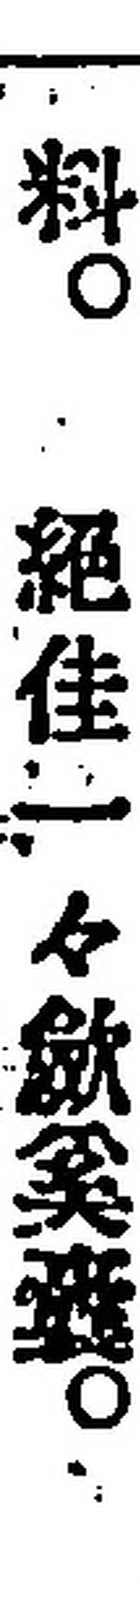料。絶佳一々歛奚嚢。
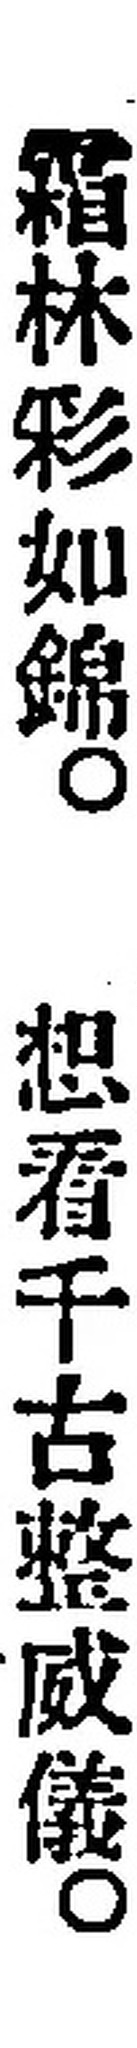霜林彩如錦。想看千古整威儀。
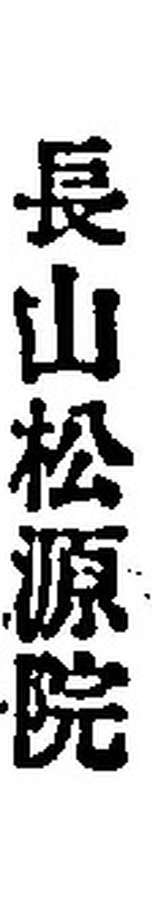長山松源院
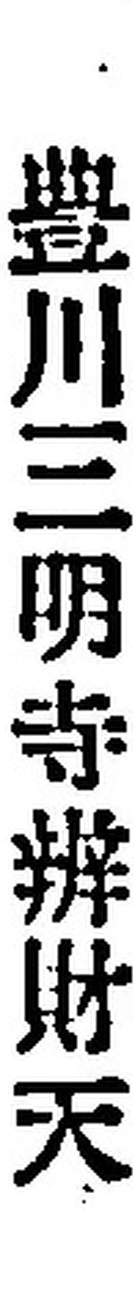豊川三明寺弁財天
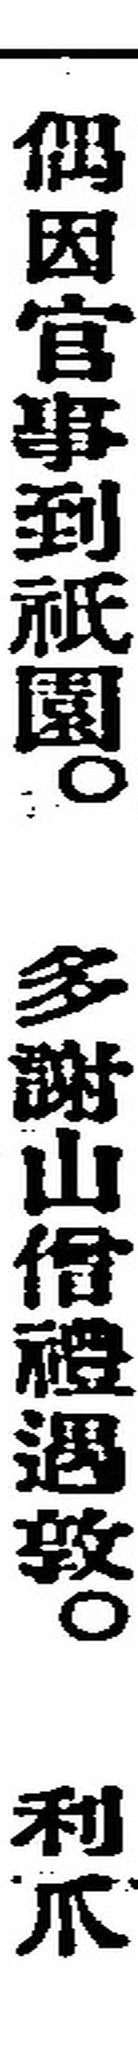偶因官事到祇園。多謝山僧礼遇敦。利爪
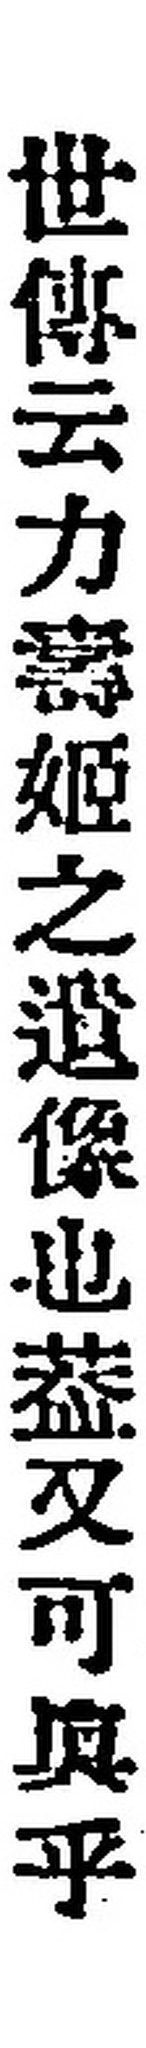世伝云力寿姫之遺像也葢又可真乎
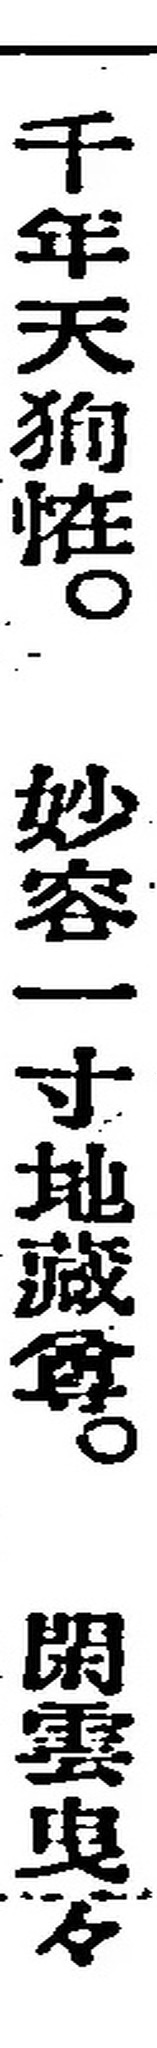千年天狗恠。妙容一寸地蔵尊。閑雲曳々
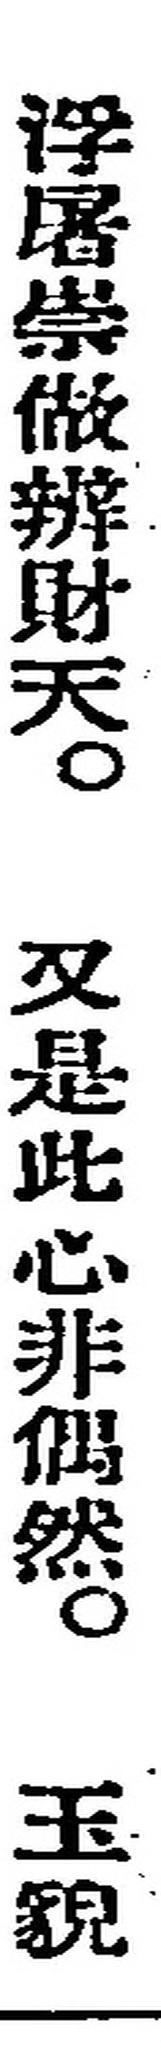浮屠崇做弁財天。又是此心非偶然。玉貌
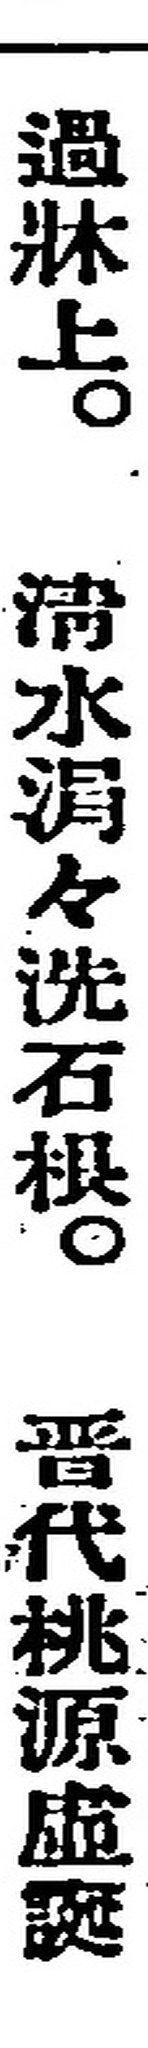過牀上。清水涓々洗石根。晋代桃源虚誕
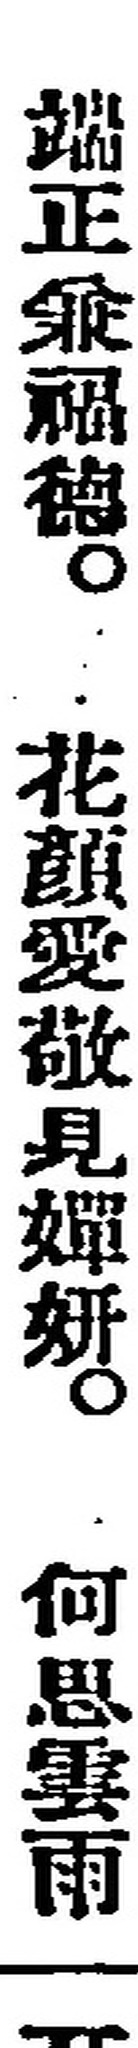端正兼福徳。花顔愛敬見嬋姸。何思雲雨
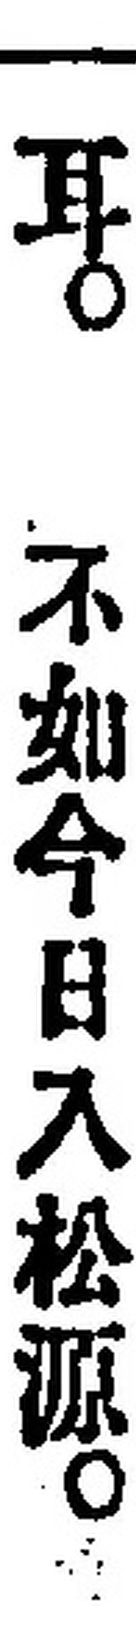耳。不如今日入松源。

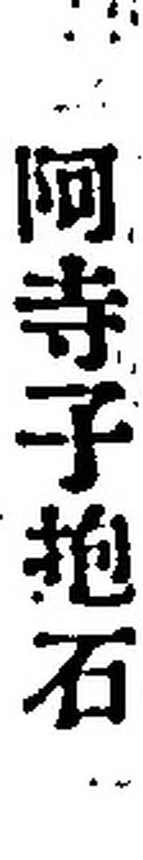阿寺子抱石
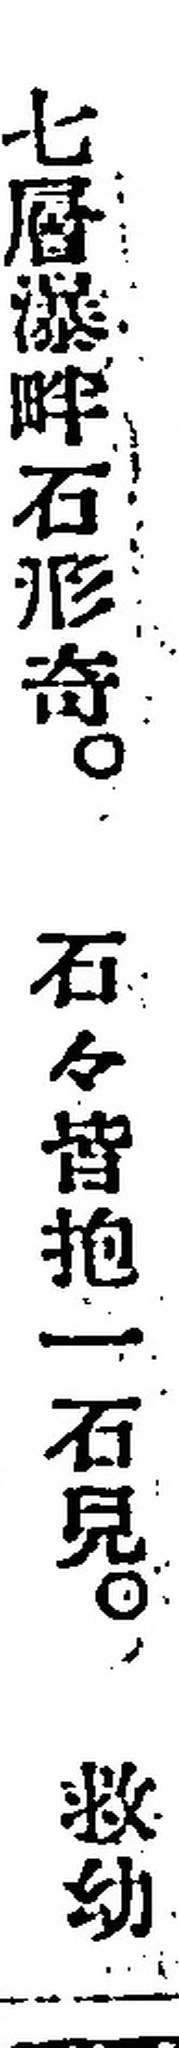七層瀑畔石形奇。石々皆抱一石児。救幼
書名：東参名勝案内
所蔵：国立国会図書館 National Diet Library, JAPAN
